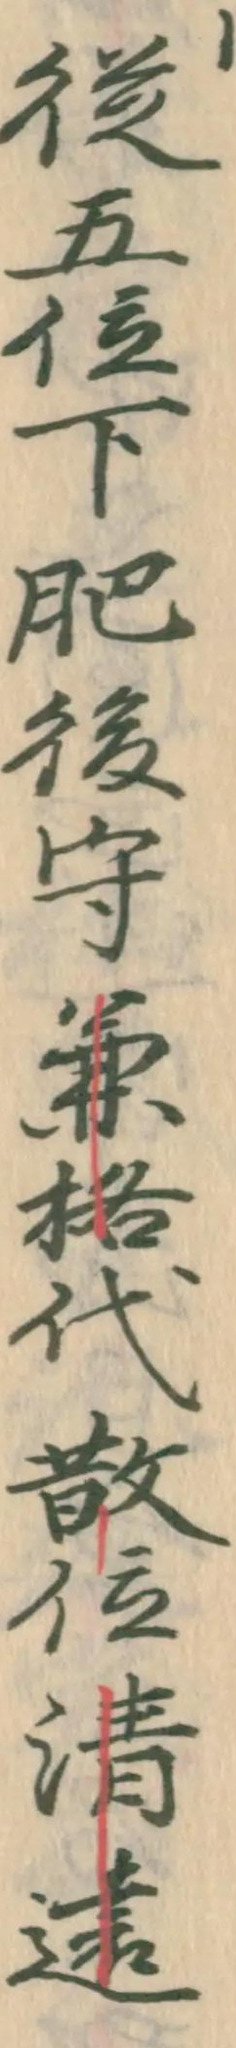従五位下肥後守兼格代散-位清遠
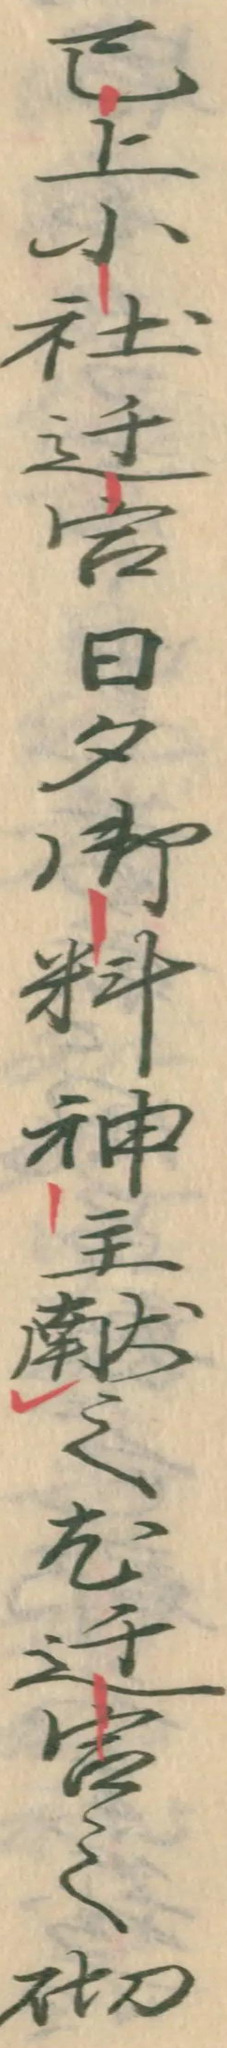已-上小-社迁-宮日夕御-料神_主献之尤迁-宮之砌
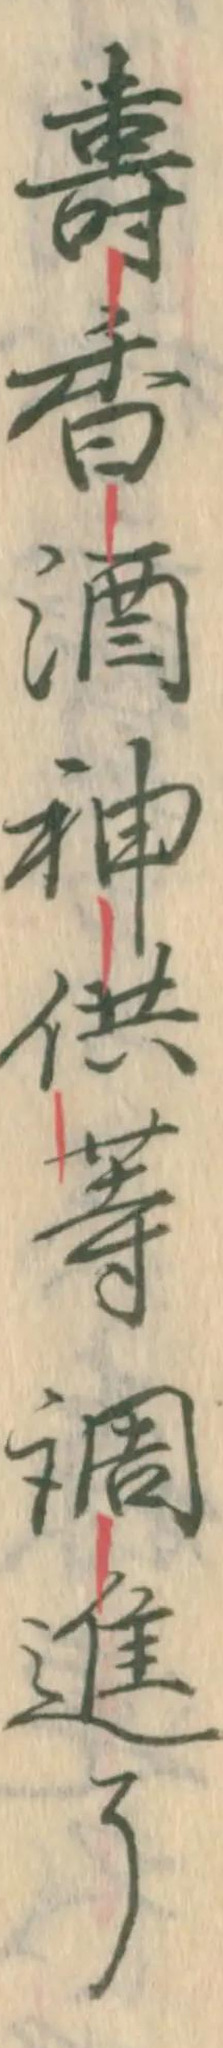寿-香-酒神-供_等調-進了

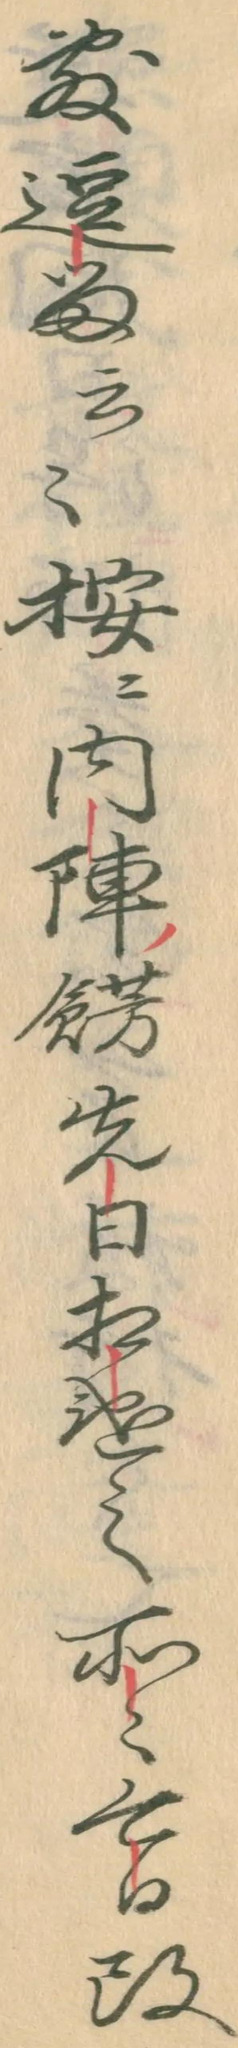敷逗-留云々按ニ内-陣錺先-日相-遣之所-々今-日改
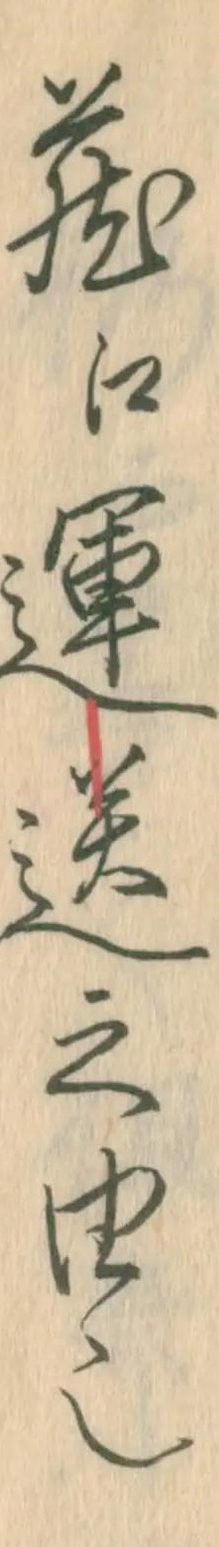蔵江運-送之由也
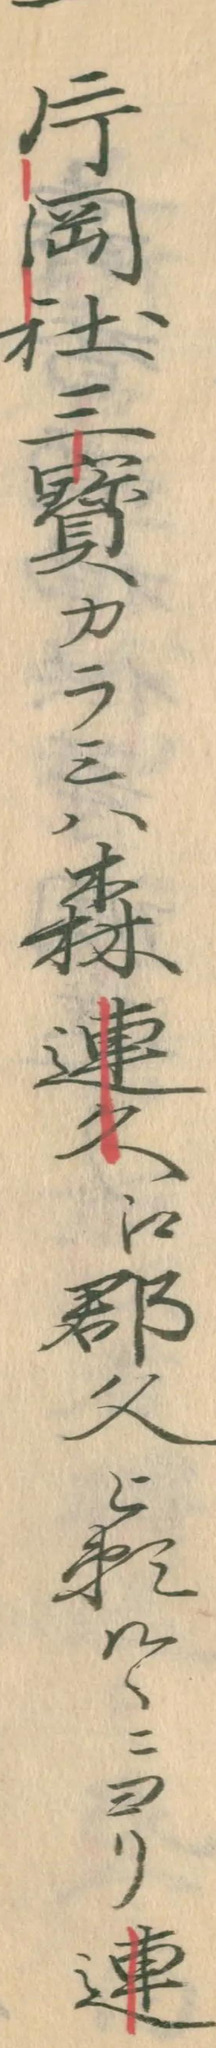一片_岡_社三-宝カラミハ森連久江郡久被頼候了ニヨリ連
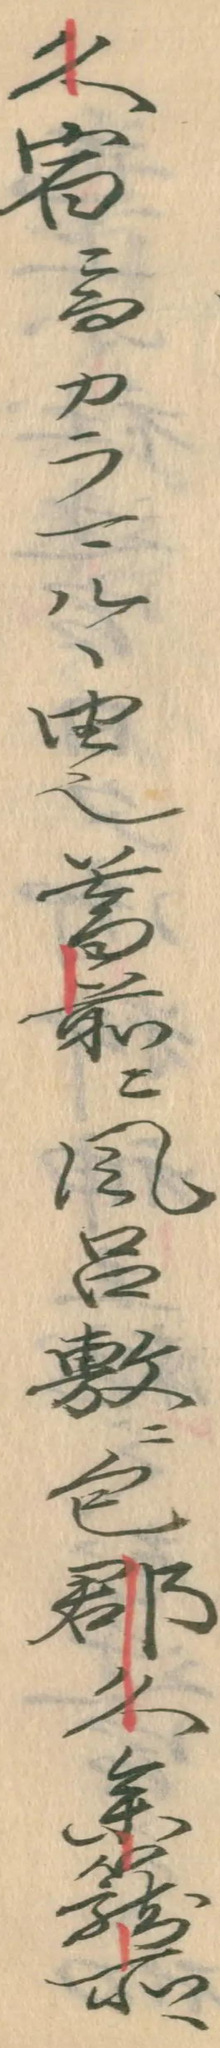久宿ニ而カラマルヽ由也暮_前ニ風呂敷ニ包郡久参-籠-所へ
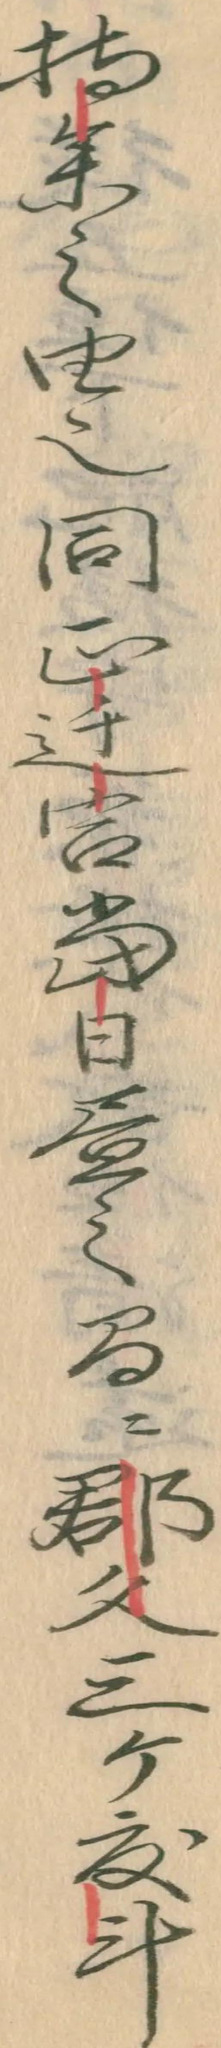持-参之由也同正-迁-宮当-日昼之間ニ郡久三ケ度_計
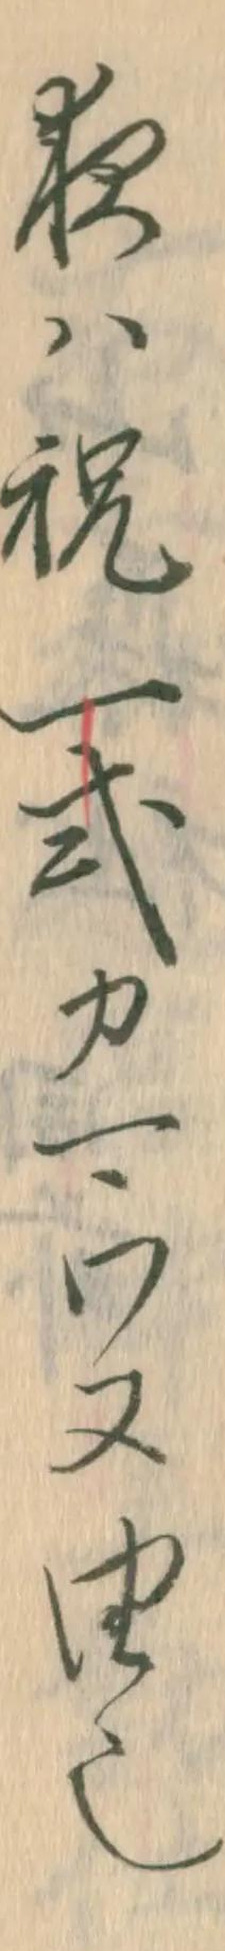夜ハ祝一-式カマワヌ由也

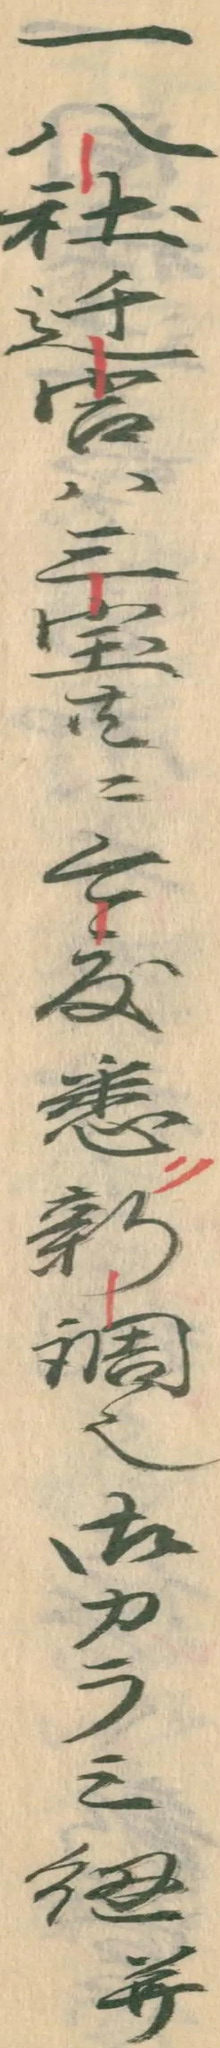一八-社迁-官ハ三-宝共ニ今-度悉新-調也御カラミ紐并
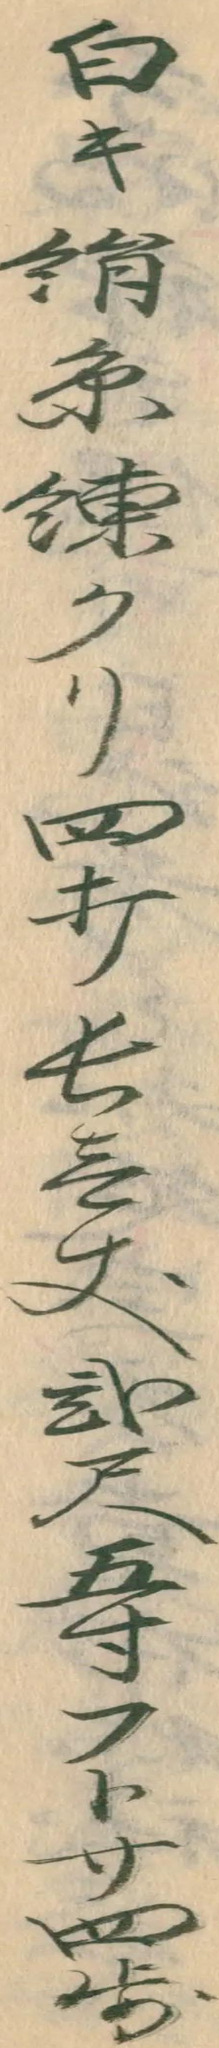白キ絹糸練クリ四打長壱丈弐尺五寸フトサ四歩
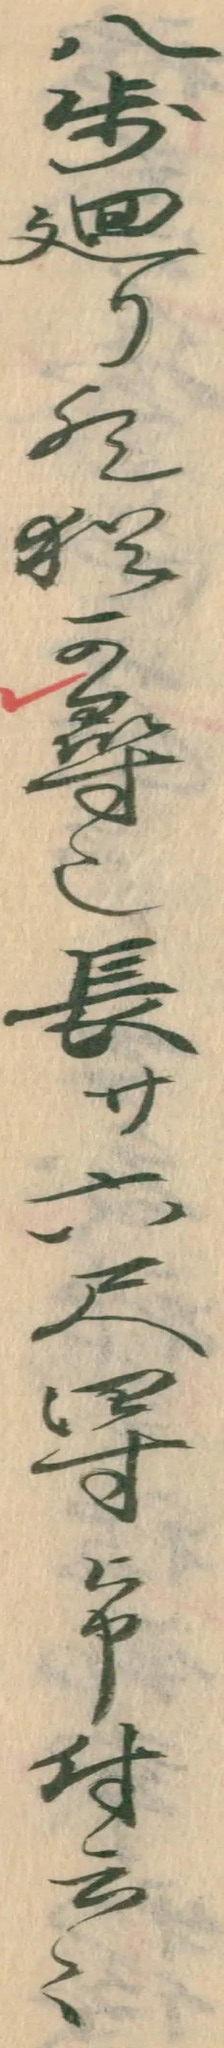八歩廻リ歟猶可尋也長サ六尺四寸被申付云々
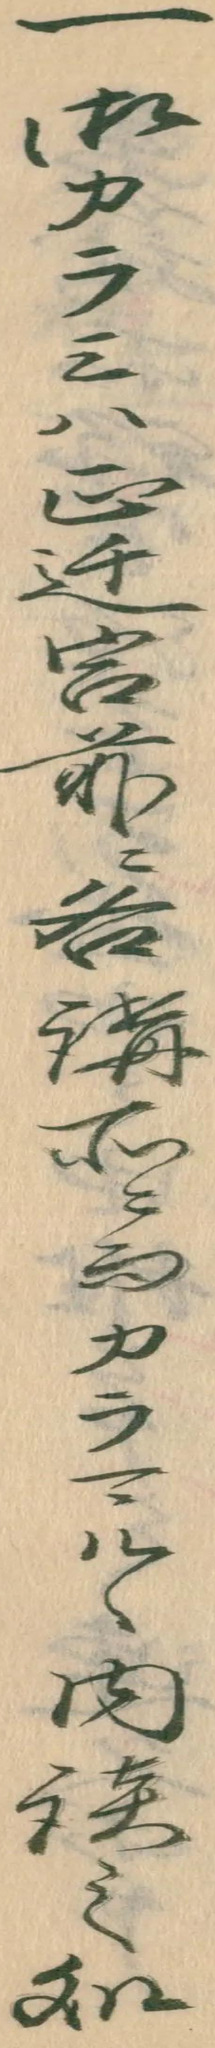一御カラミハ正迁宮前ニ各講所ニ而カラマルヽ内談之処
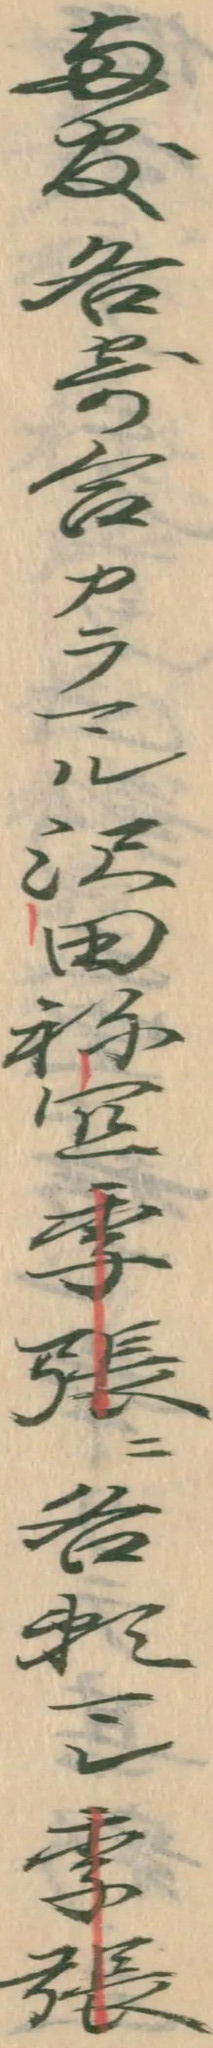両官各寄合カラマル沢_田祢-宜季張ニ各頼マレ季張
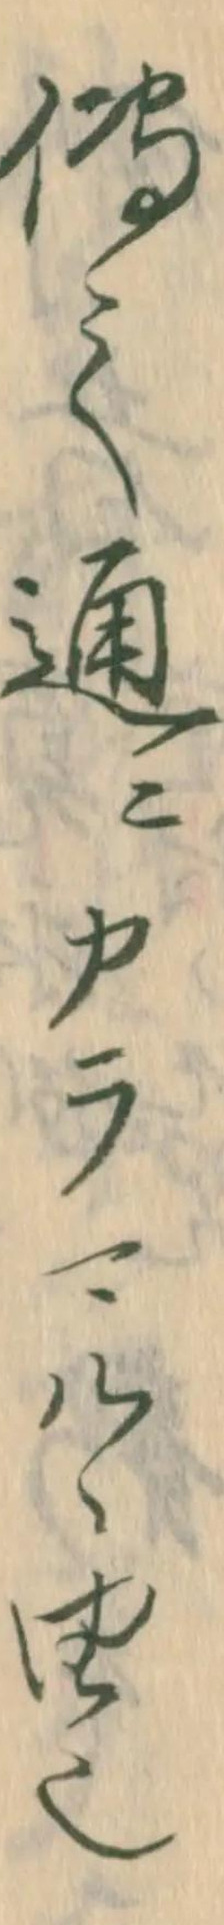伝之通ニカラマルヽ由也
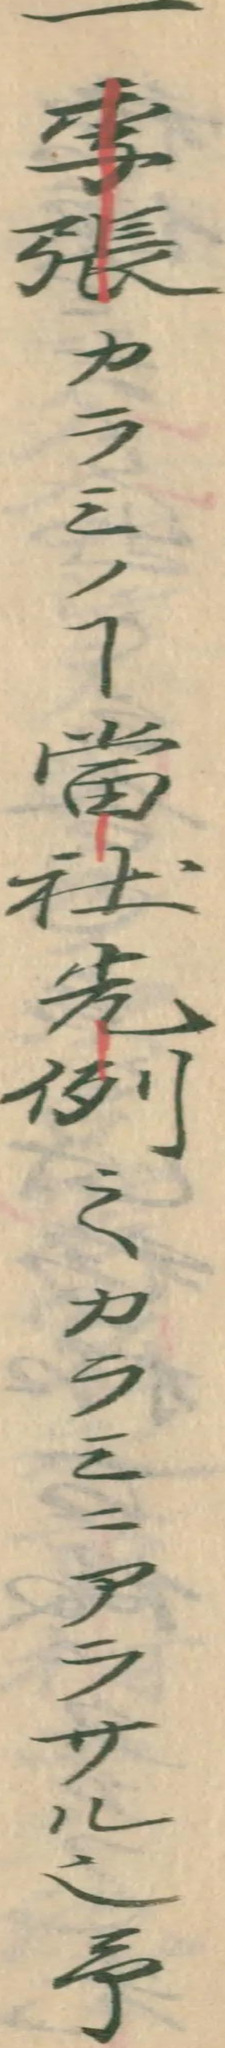一季張カラミノコト当-社先-例之カラミニアラサル也予
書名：賀茂社記録. 第16冊
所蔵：国立国会図書館 National Diet Library, JAPAN
